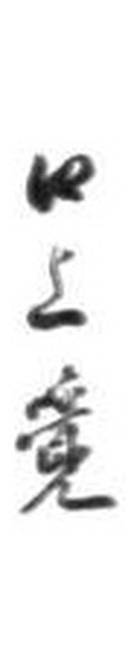口上覚
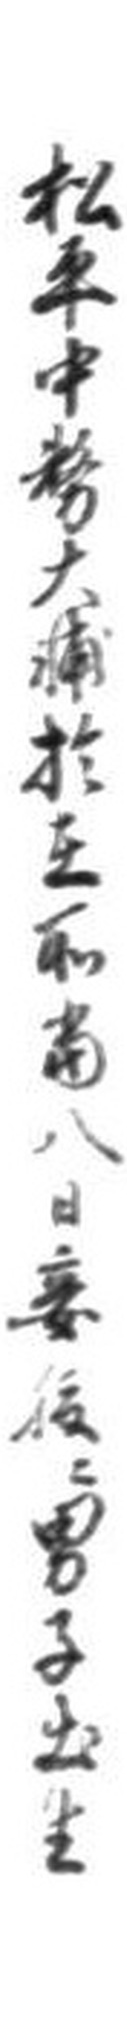松平中務大輔於在所当八日妾腹ニ男子出生
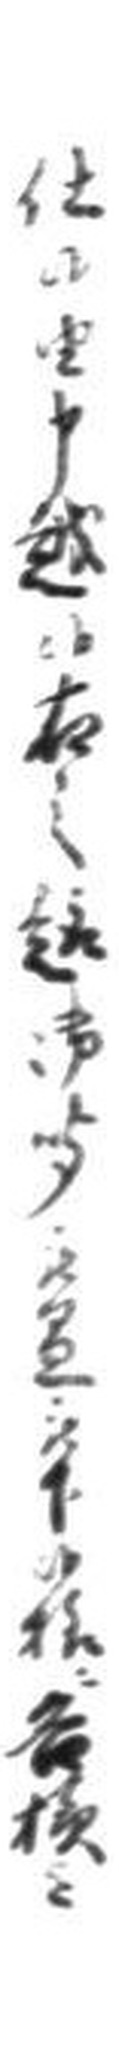仕候由申越候右之趣御聞被置被下候様ニ各様迄

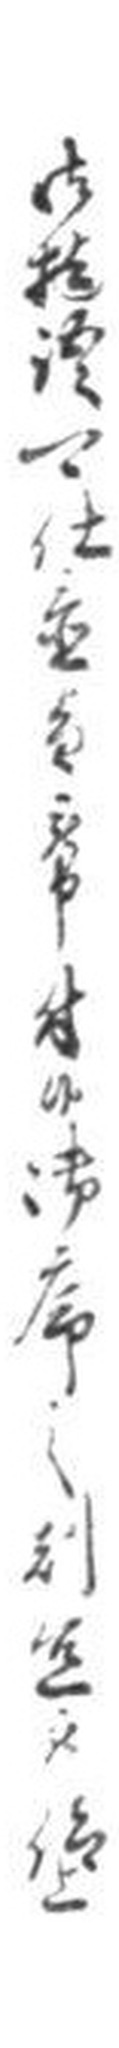御物語可仕置旨被申付候御序之刻宜被仰上
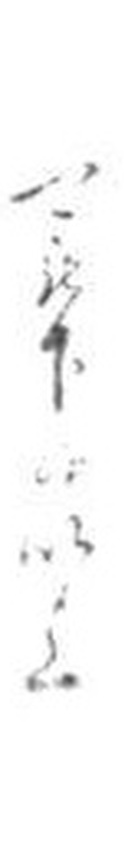可被下候以上
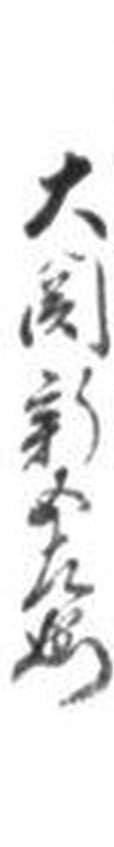大関新五左衛門
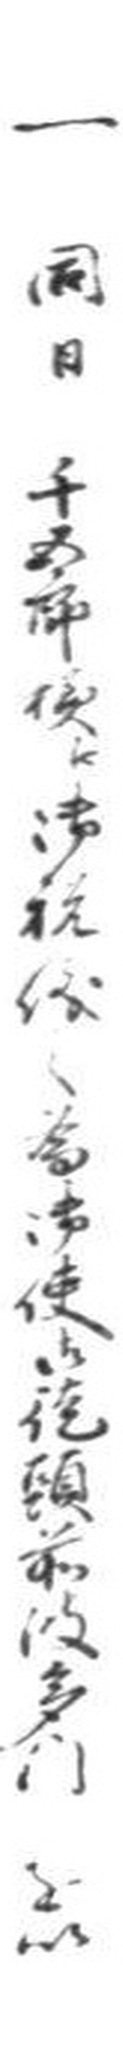一同日千五郎様江御祝儀之為御使御徒頭前波多門を以
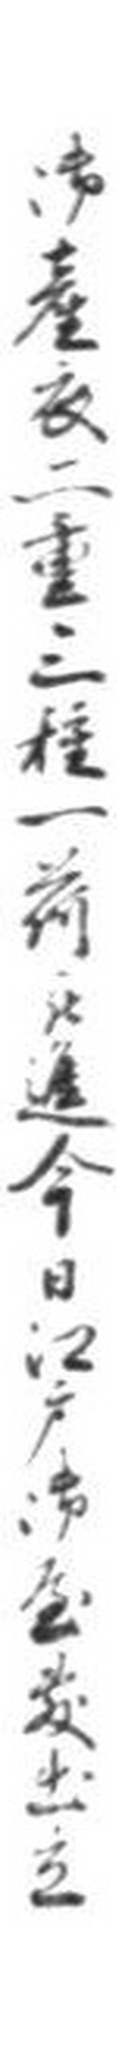御産衣二重三種一荷被進今日江戸御屋敷出立
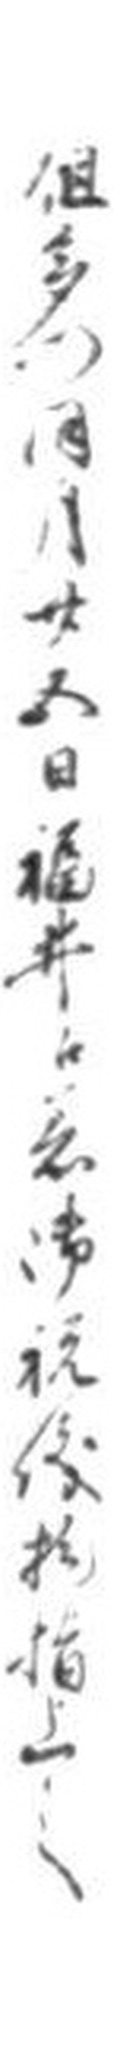但多門同月廿五日福井江着御祝儀物指上之
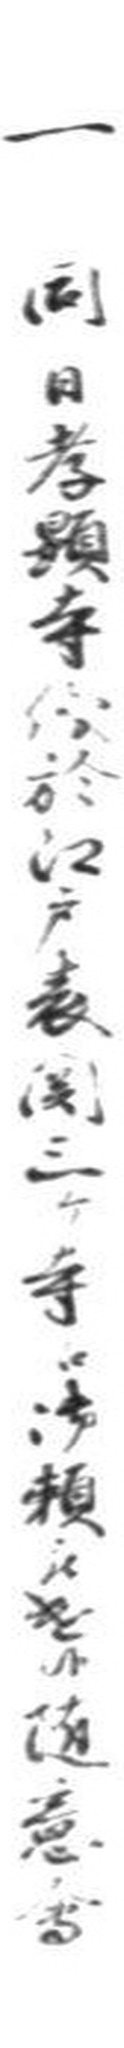一同日孝顕寺儀於江戸表関三ケ寺江御頼被遣候随意会
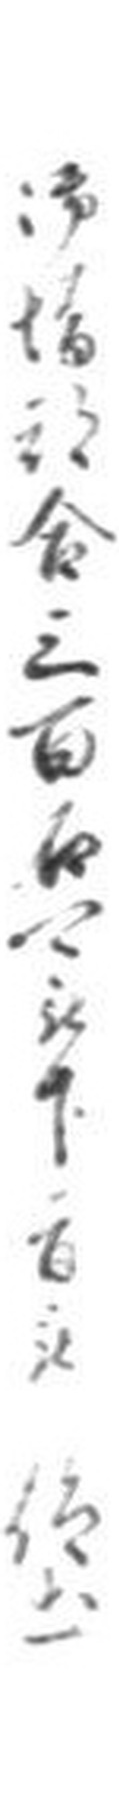御増都合三百石可被下旨被仰出
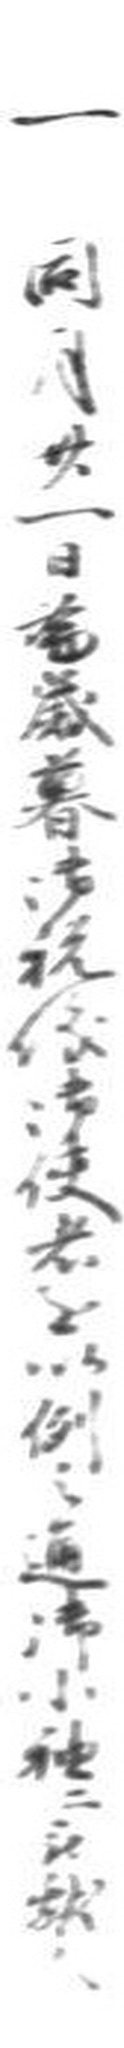一同月廿一日為歳暮御祝儀御使者を以例之通御小袖二被献之
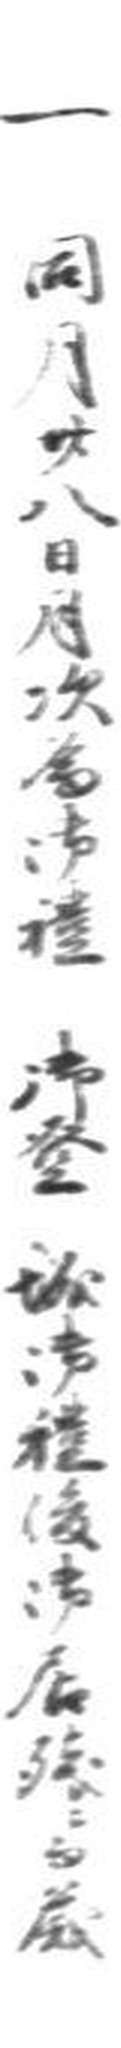一同月廿八日月次為御礼御登城御礼後御居残ニ而歳
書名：家譜 三十六 宗昌公 従享保八年到同九年
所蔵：福井県文書館 Fukui Prefectural Archives
